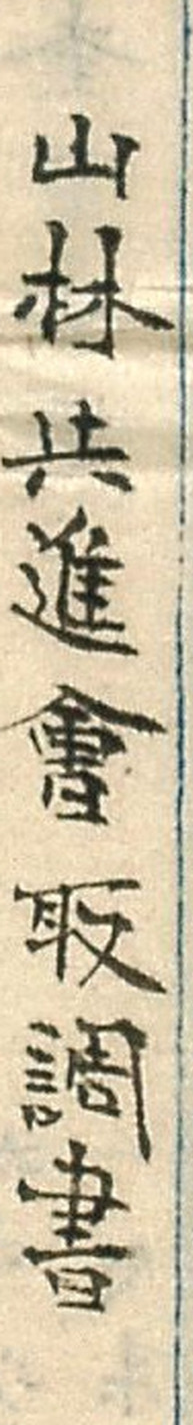山林共進会取調書
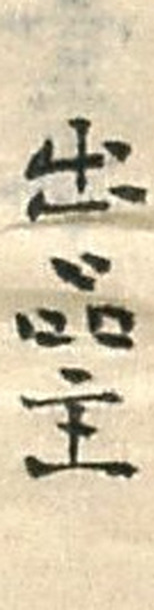出品主
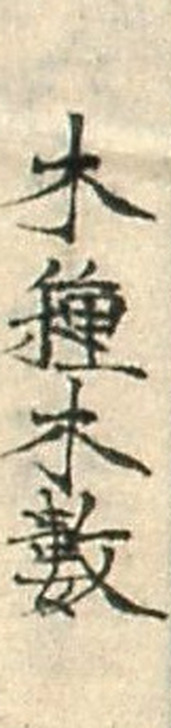木種木数

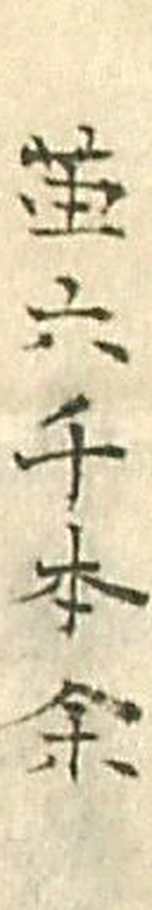苗六千本余
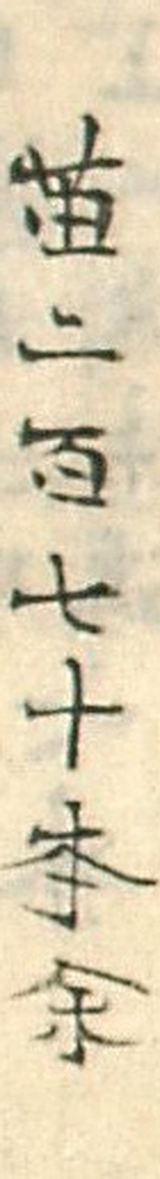苗二百七十本余
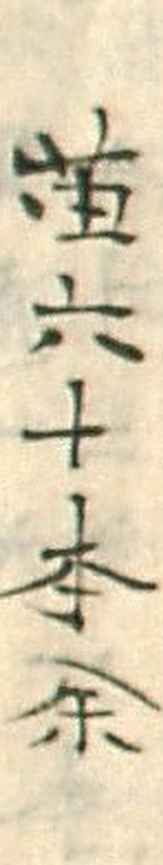苗六十本余

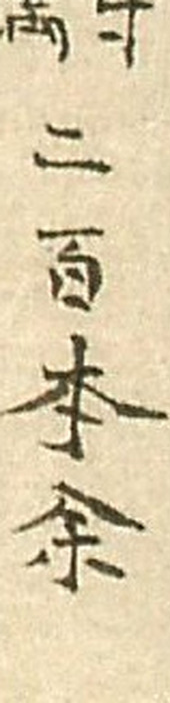苗百本余
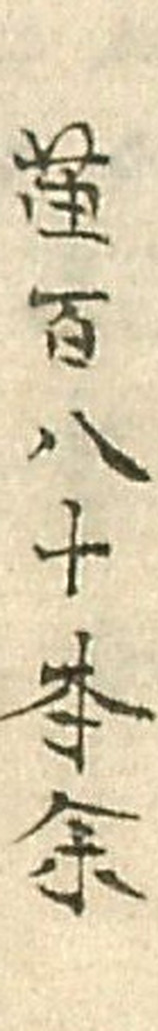苗百八十本余
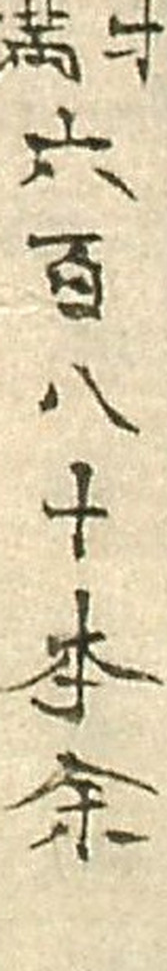苗百八十本余
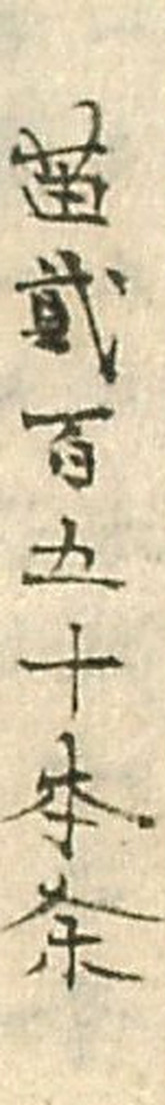苗弐百五十本余
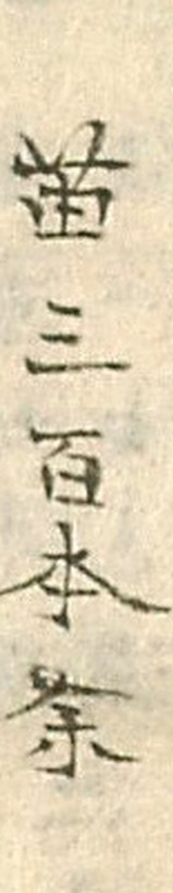苗三百本余
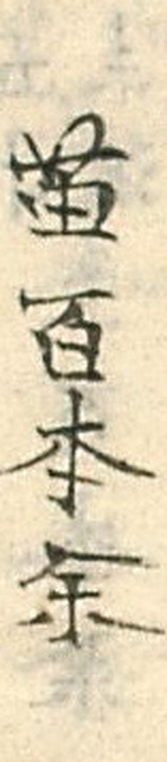苗百本余
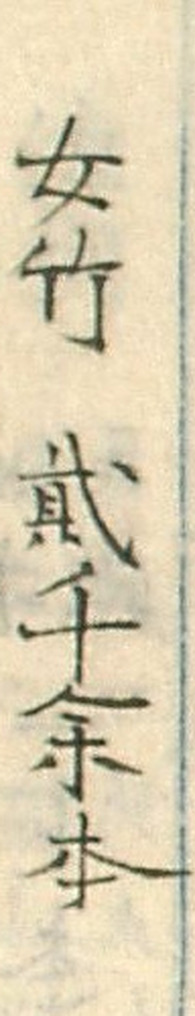女竹弐千余本
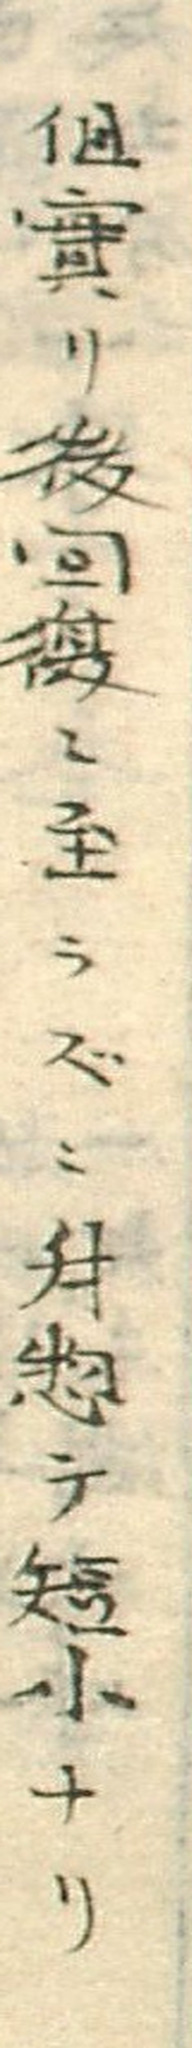但実リ後回復二至ラズニ付惣テ短小ナリ

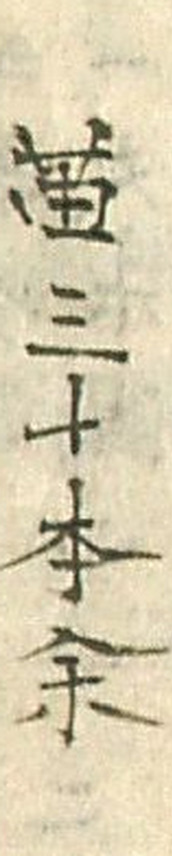苗三十本余
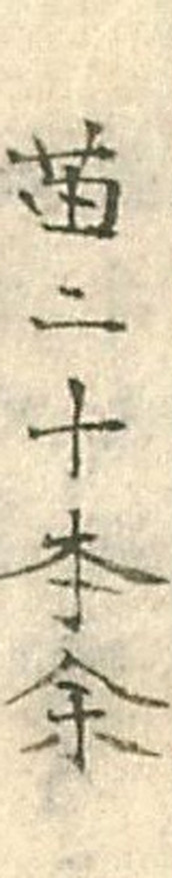苗二十本余
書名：山林共進会取調書
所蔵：鳴門教育大学 Naruto University of Education
